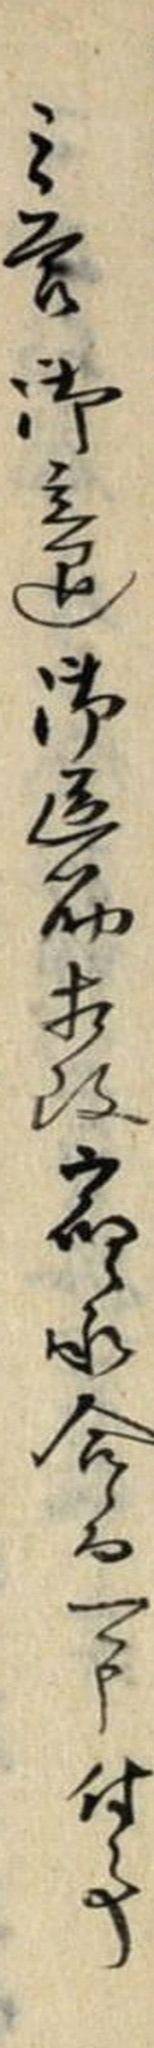之節御立退御道筋相改宿へ承合候て可申付事
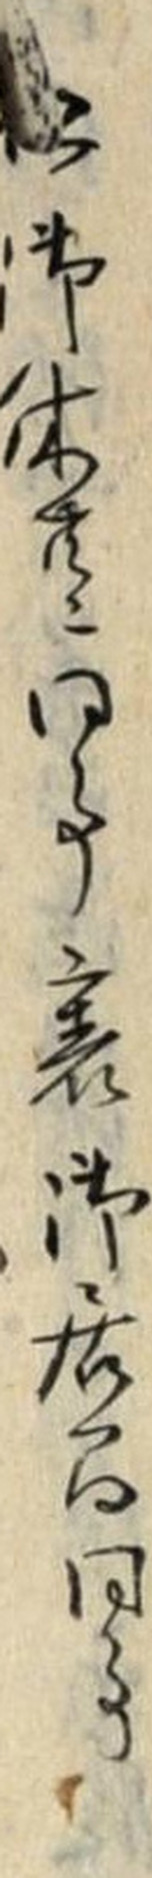但御休共に同事裏御居間同事
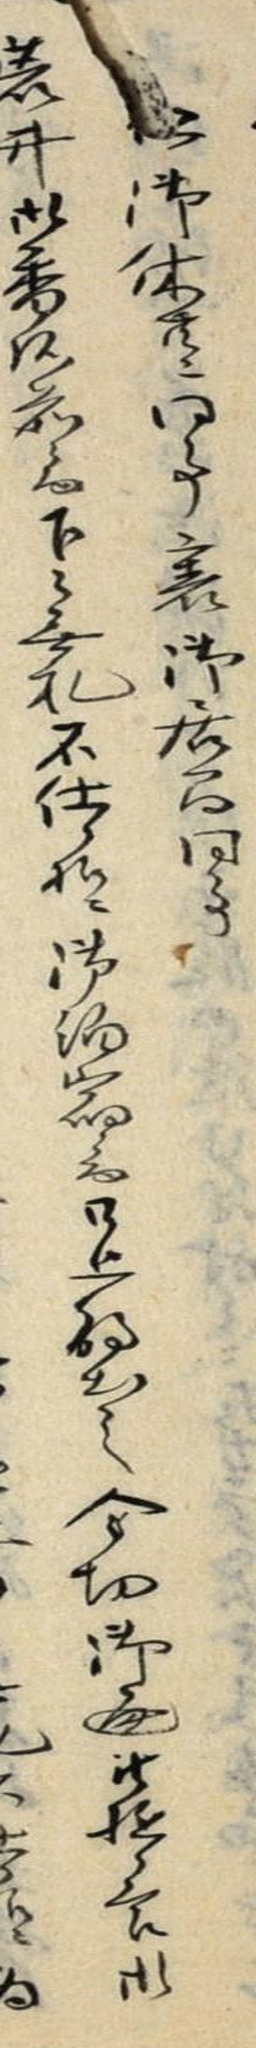一荒井御番所前にて下々無礼不仕様に御泊宿にて口上触出之今切御通被遊候節御
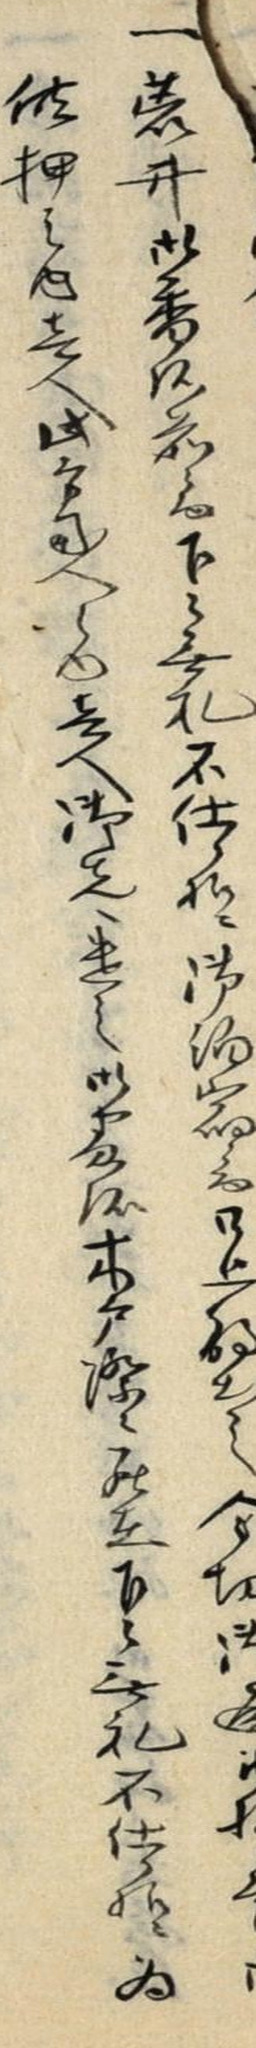供押之内壱人此方用人之内壱人御先へ遣之御番所木戸際に罷在下々無礼不仕候様に為
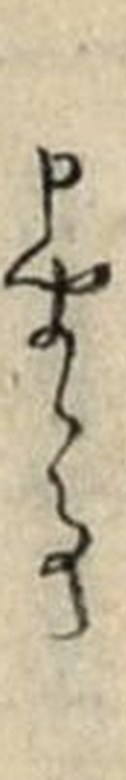申聞候事
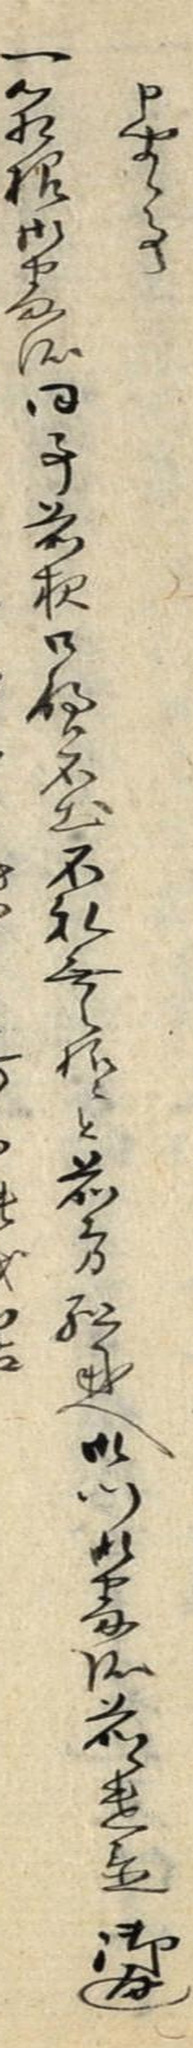一箱根御番所同事前夜口触は不出不礼無之様にと前方組用人御門御番所前へ遣置御通
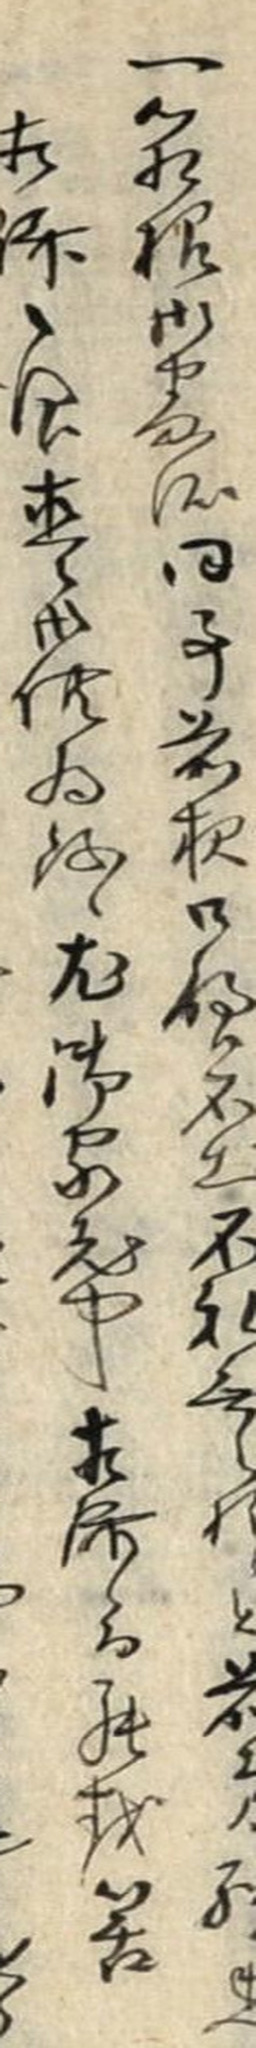相済候得は直に御供為致候尤御家老中相済候て罷越筈
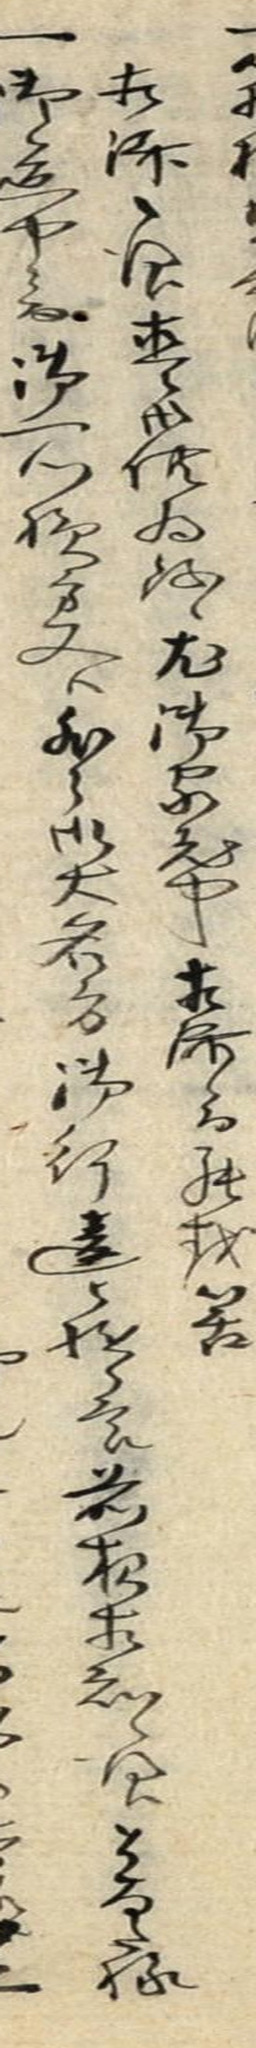一御道中にて御一門様方又は外之御大名方御行違被遊候節前夜相知候得はとなた様
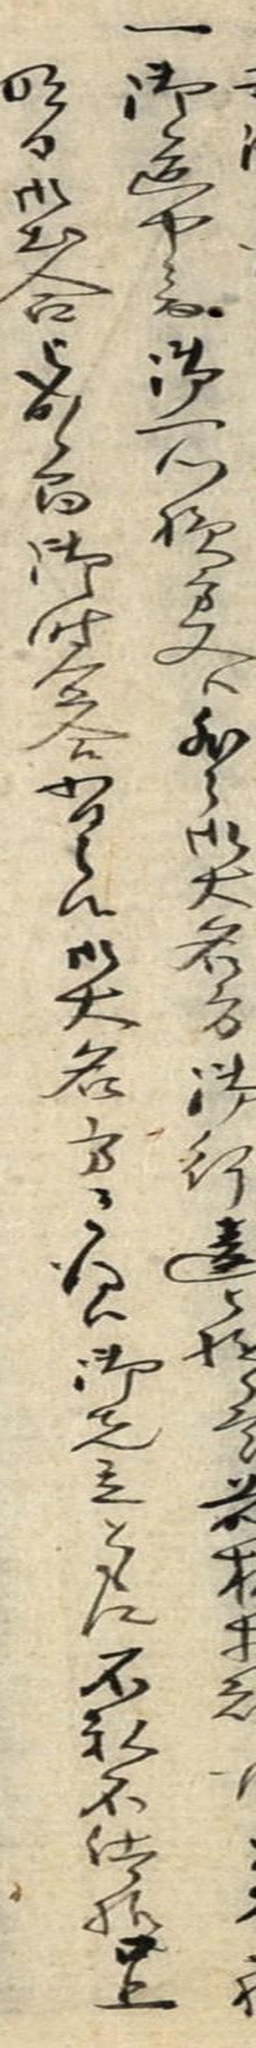明日御出合被成候間御時宜合有之候御大名方に候得は御先立とも江不礼不仕候様口上
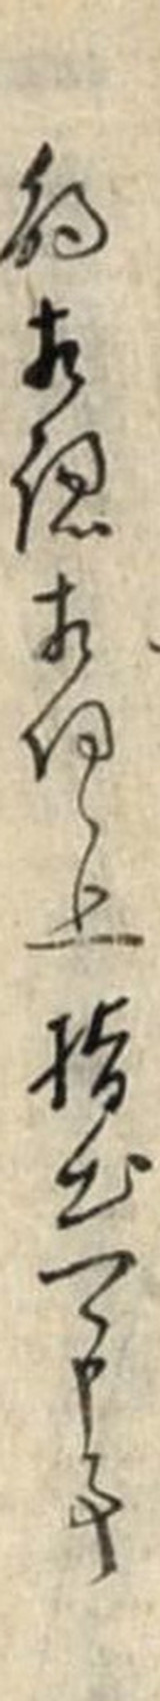触相認相伺之上指出可申事
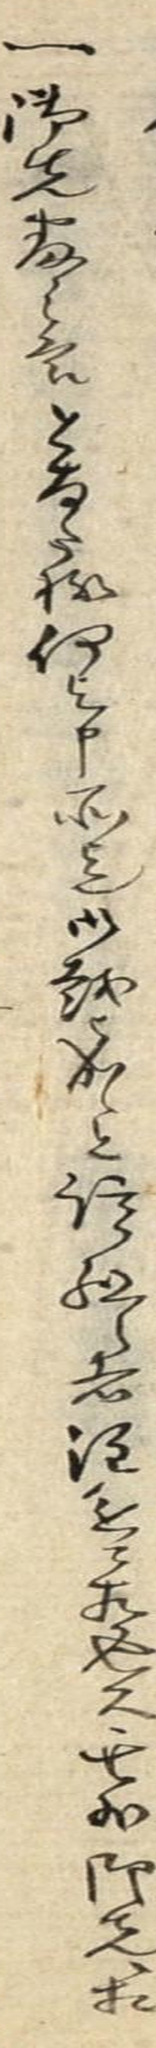一御先番之節となた様何と申所迄御越被成候と跡へ組之者注進に相返す其外御先へ相
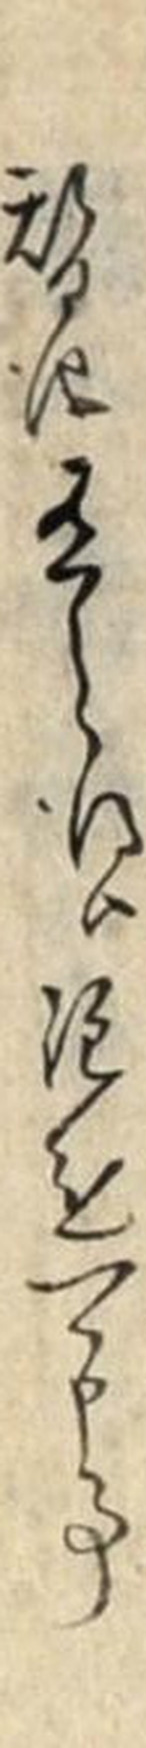替儀有之候得は注進可申事
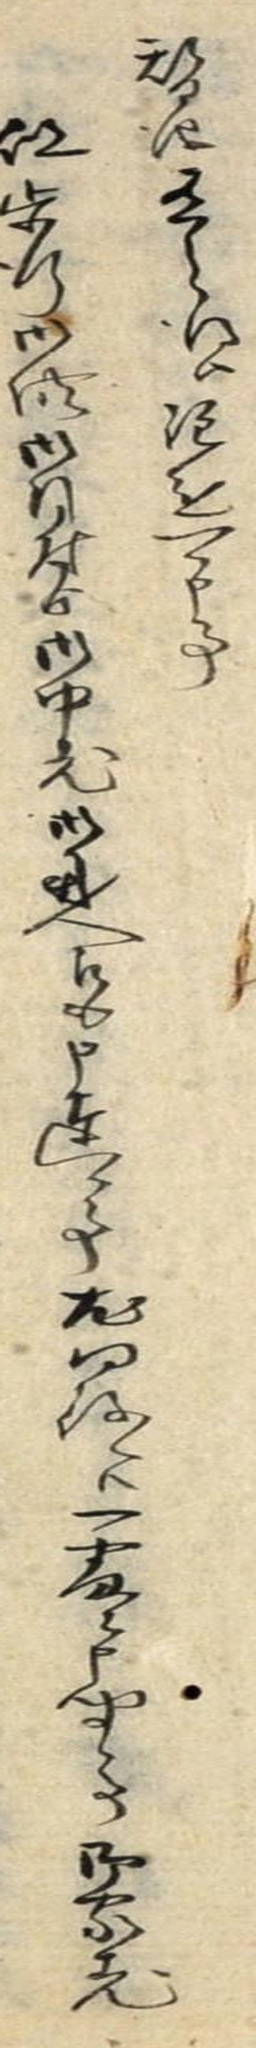但歩行御供御目付ゟ御中老御用人江も申達候事尤同役へは一番に申聞事御家老
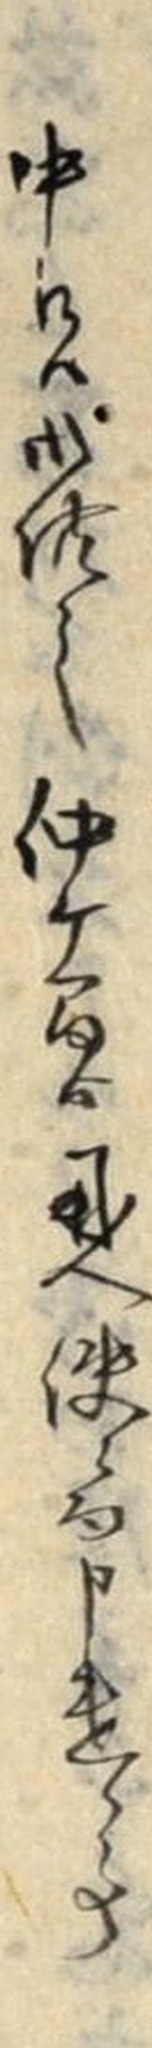中江は御供之仲ヶ間ゟ用人使にて申遣候事

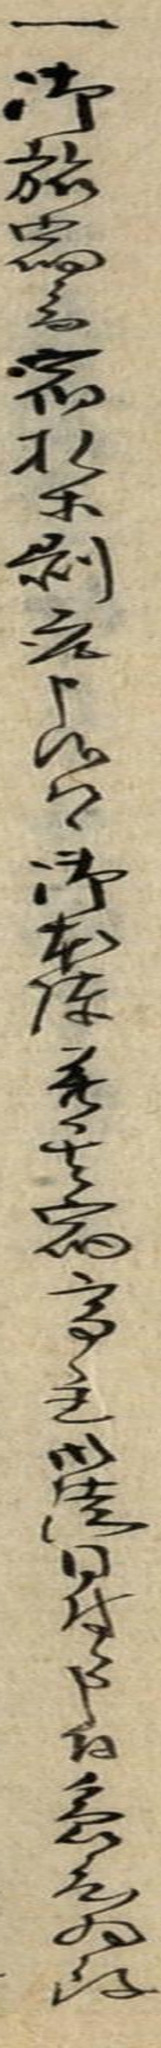一御旅宿にて宿札等剥取申候はゝ御本陣并其宿亭主御徒目付へ申付急度為致
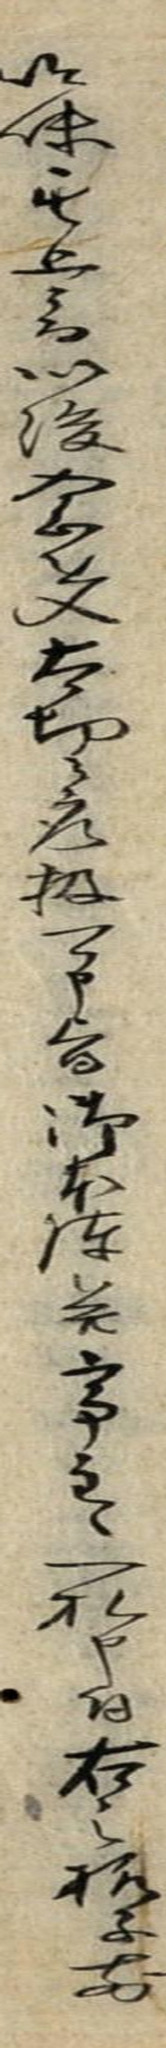吟味其上にて以後念を入大切に取扱可申旨御本陣并亭主へ一札申付右之様子前
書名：三都并道中之部
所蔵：福井県文書館 Fukui Prefectural Archives
